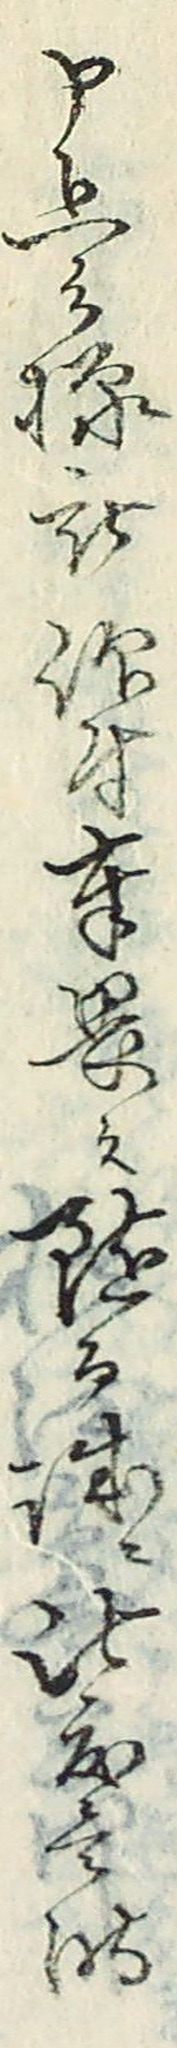申上候様被仰付奉畏候随而誠ニ此度壱時
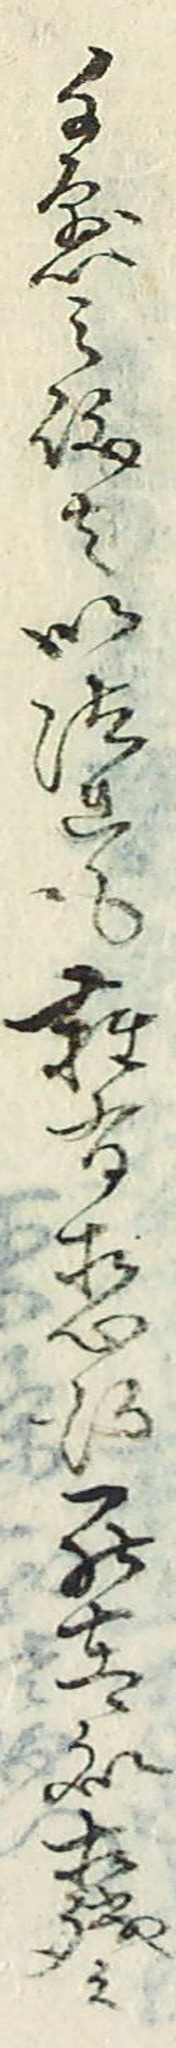手懸之儀者いつれも難有相心得罷在候処相残候
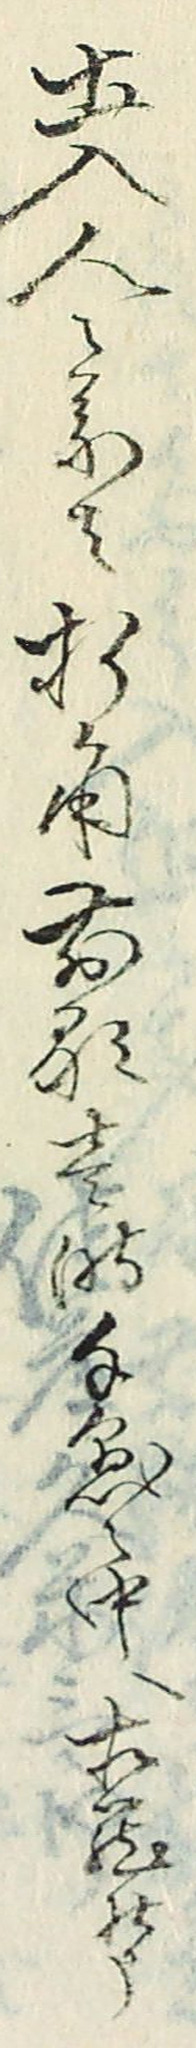出入人之義者折角前顕壱時手懸之中へ相籠居申
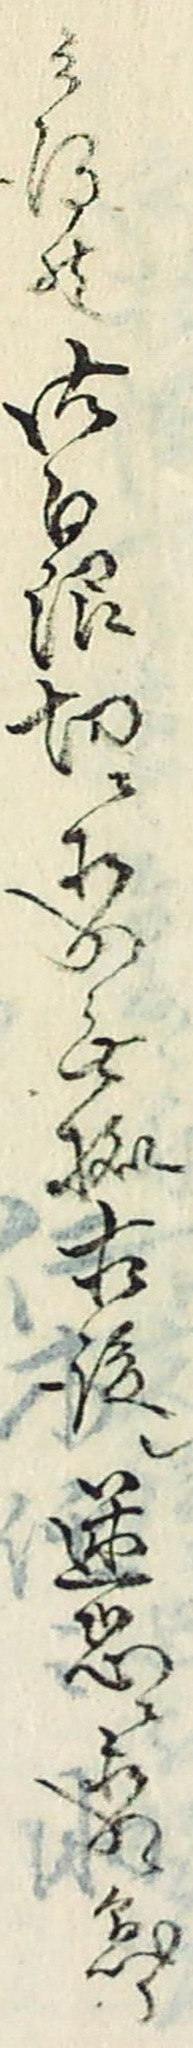候得共御日限切ニ相成無拠相後レ迷惑ニ相成候懸り
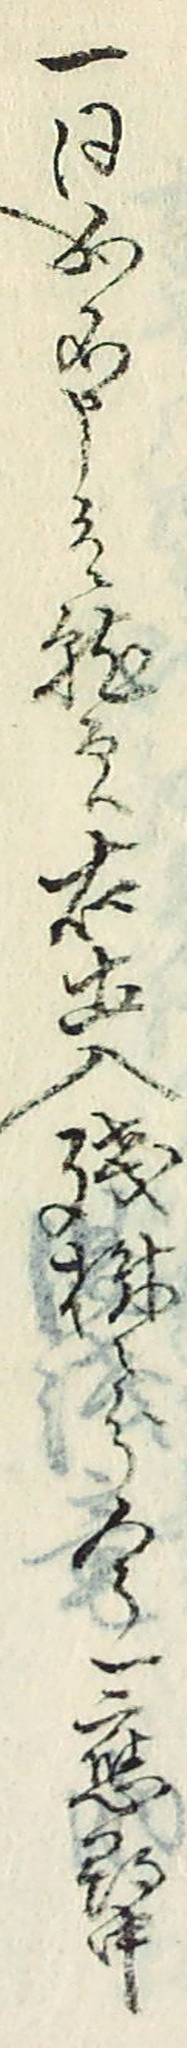一同成不申候ニ就而ハ右出入残株之分今一應郡中
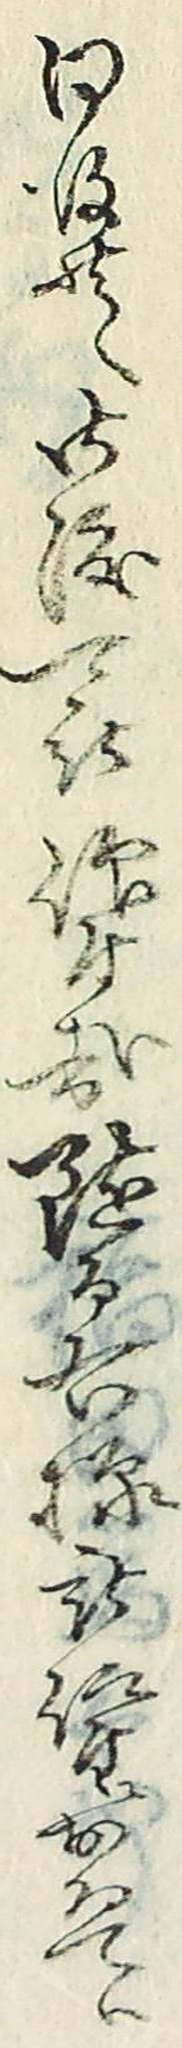同役共へ御渡可被仰付哉随而右様被仰付ニおゐてハ
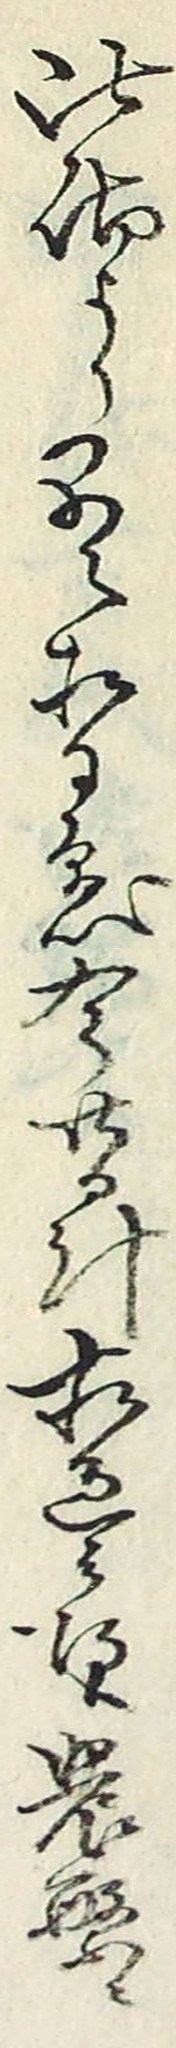此砌より早々相手懸今廿日計相過候得ハ農繁ニ
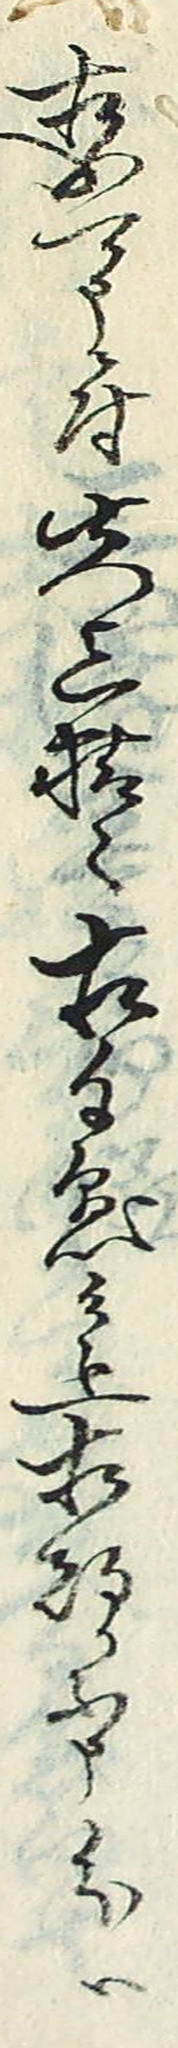相成可申ニ付夫迄精々相手懸候上相都り不申分ハ
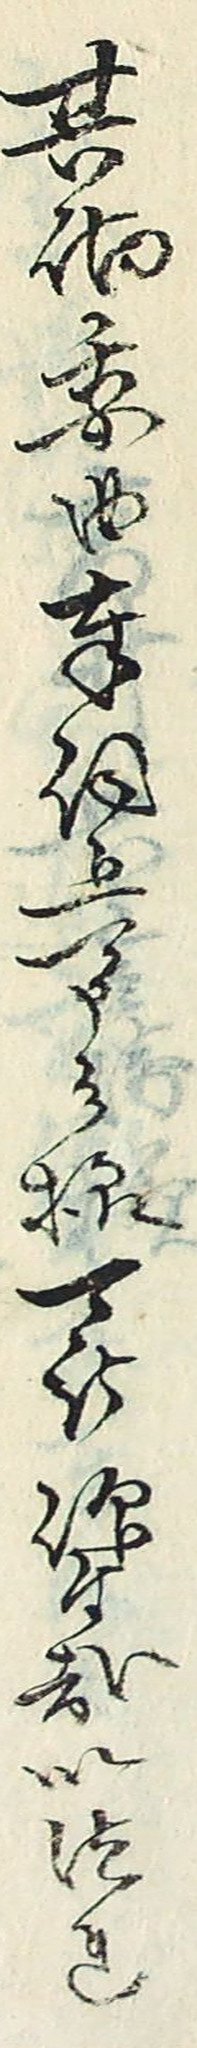其砌委曲奉伺上可申候様可被仰付哉いつれ
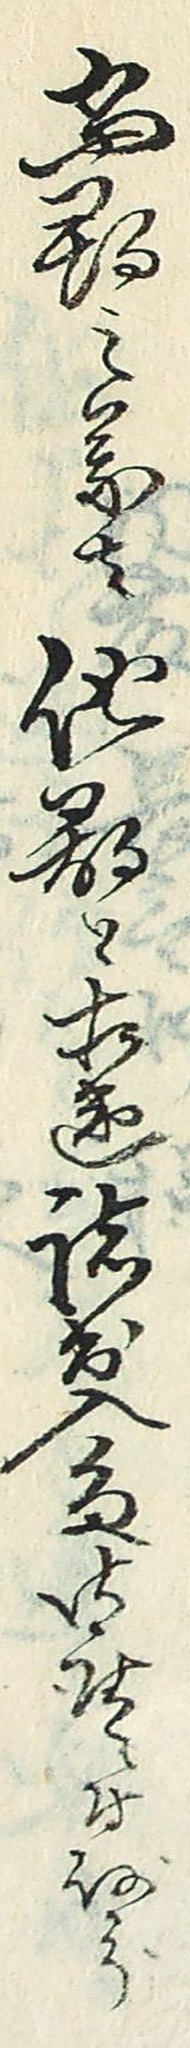當郡之義者他郡と相違諸出入多御座候ニ付何分
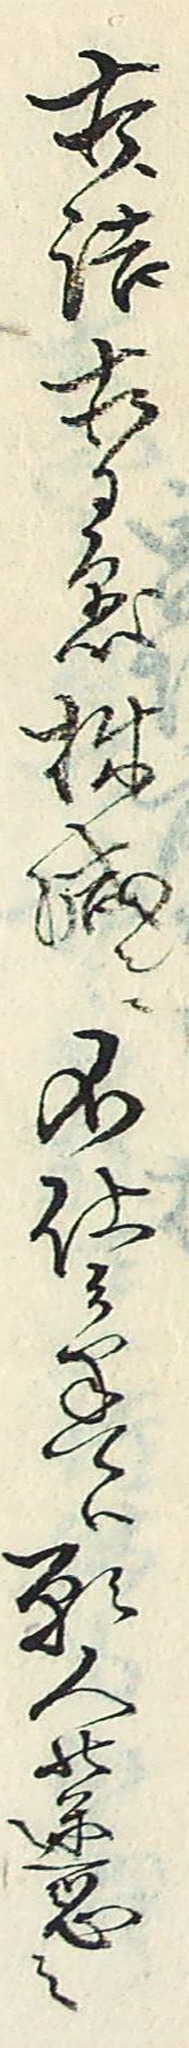相詰相手懸株減シニ不仕候半てハ願人共迷惑之

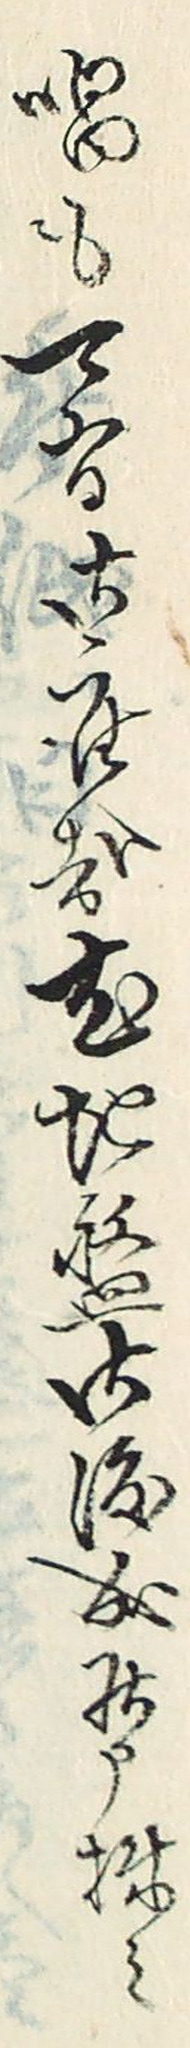唱も可有御座哉尤地盤御渡成居申株之
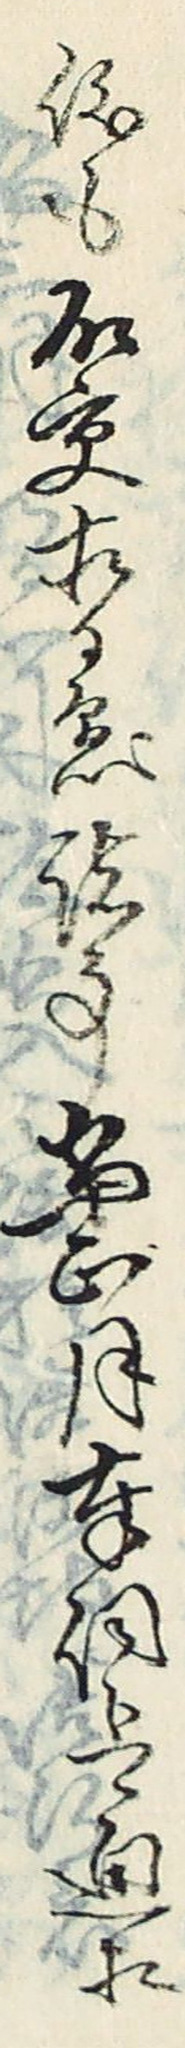儀も取交相手懸諸事當正月奉伺上候通相
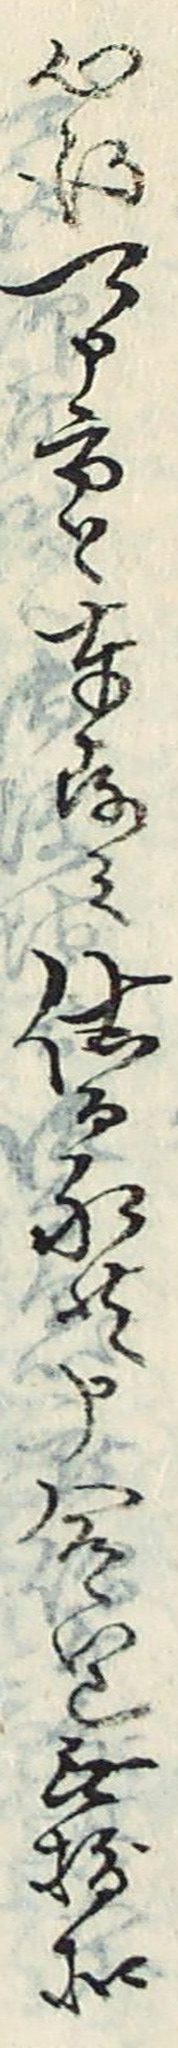心得可申方と奉存候依而私共申合候運無指扣
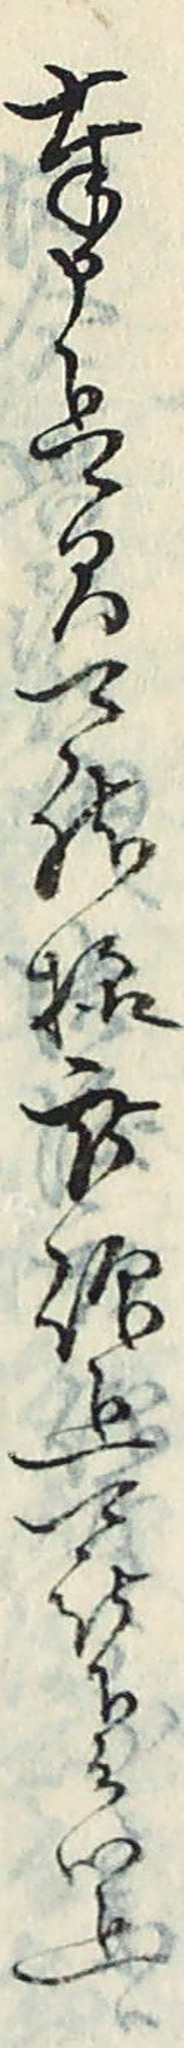奉申上候間可然様被仰上可被下候以上
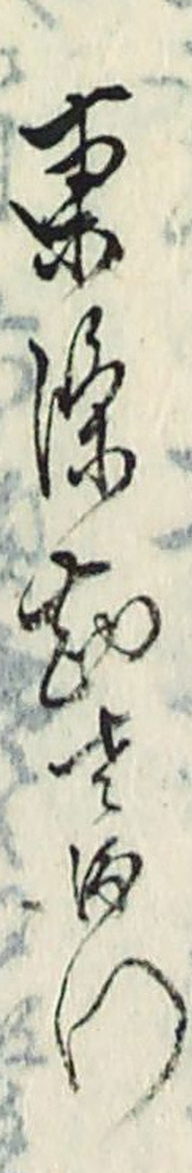東條勘左衛門
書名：諸御趣意書并御下知向之写
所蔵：鳴門教育大学 Naruto University of Education
